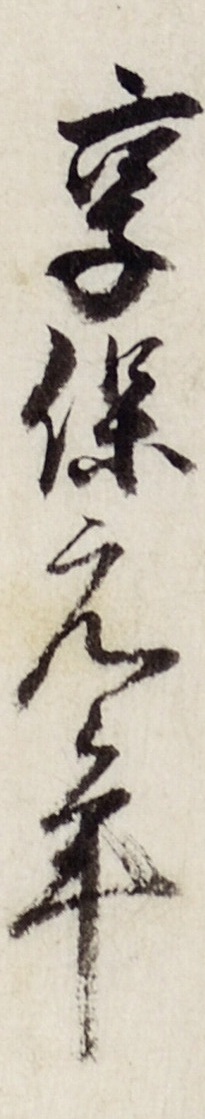享保元年
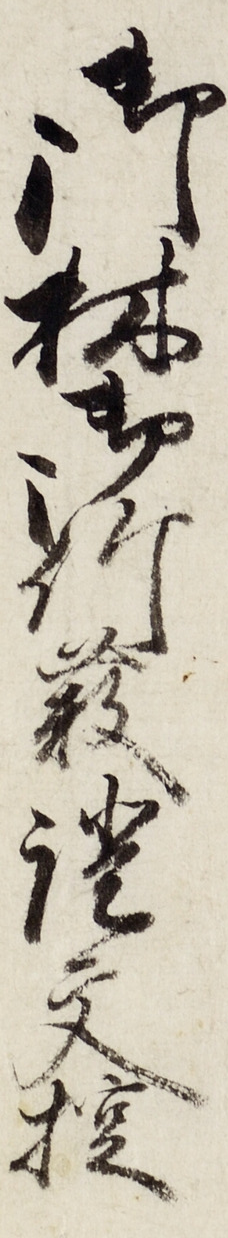御林御竹藪証文控
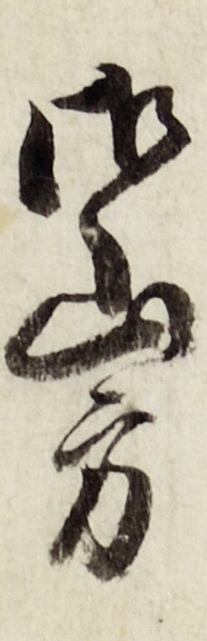御山方

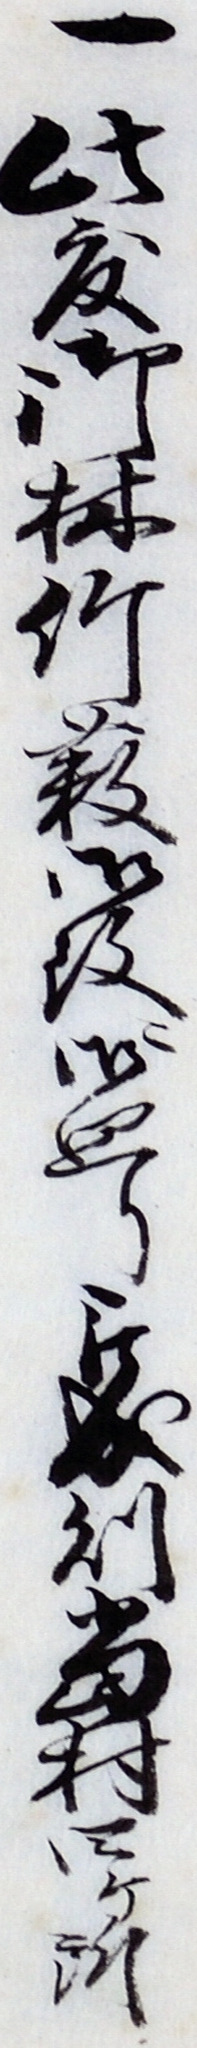一此度御林竹藪御役に御廻り罷成則当村四ヶ所
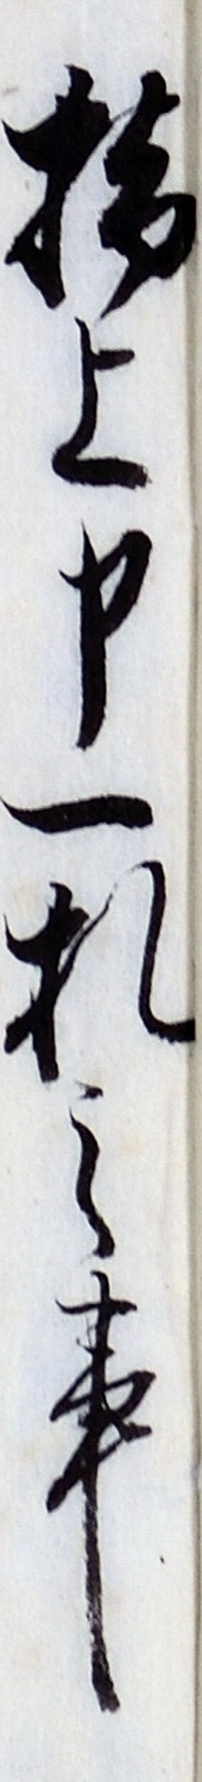指上申一札之事
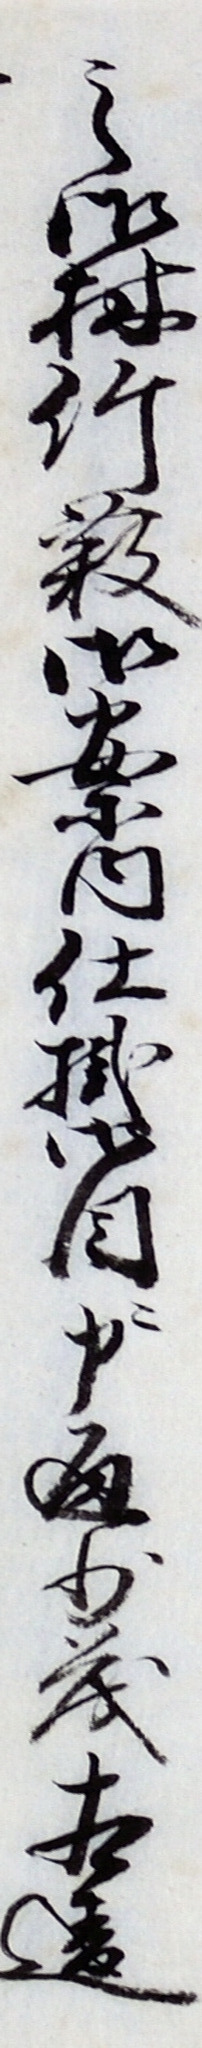之御林竹藪御案内仕掛御目に申通少も相違
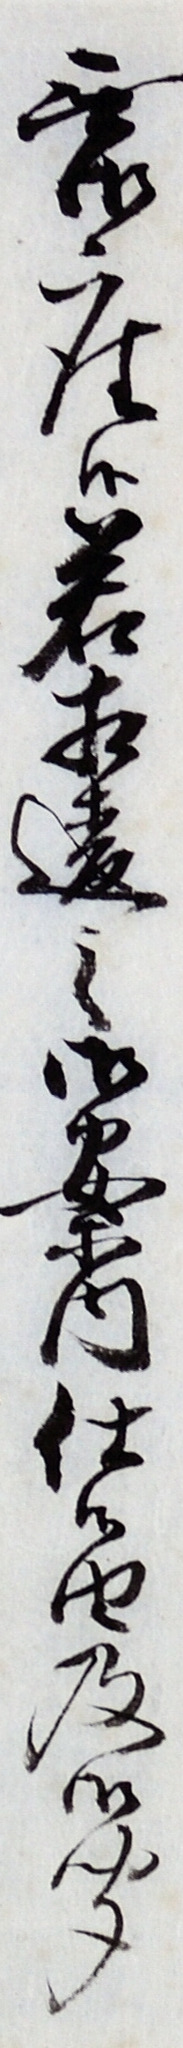無御座候若相違之御案内仕候由及御聞
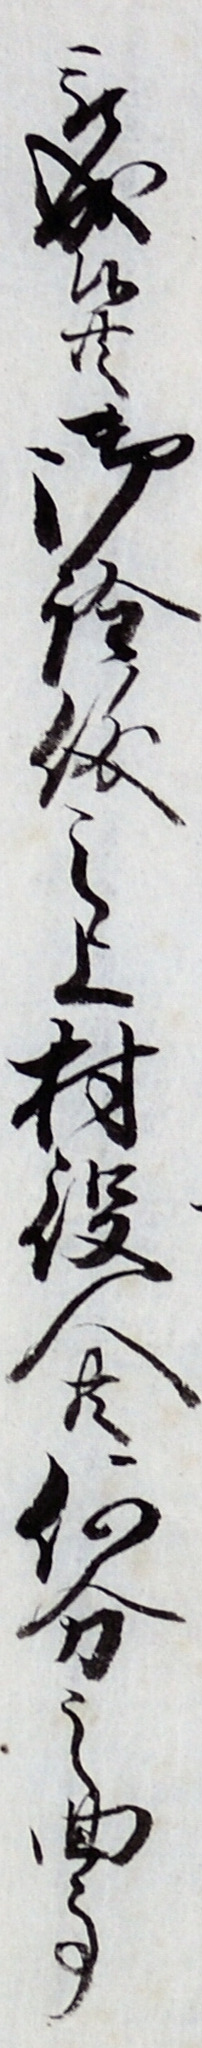被成候共御詮儀之上村役人共何分之曲事
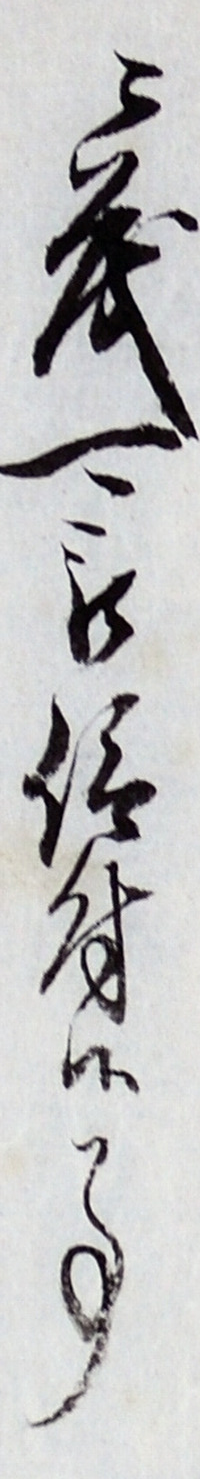にも可被仰付候事
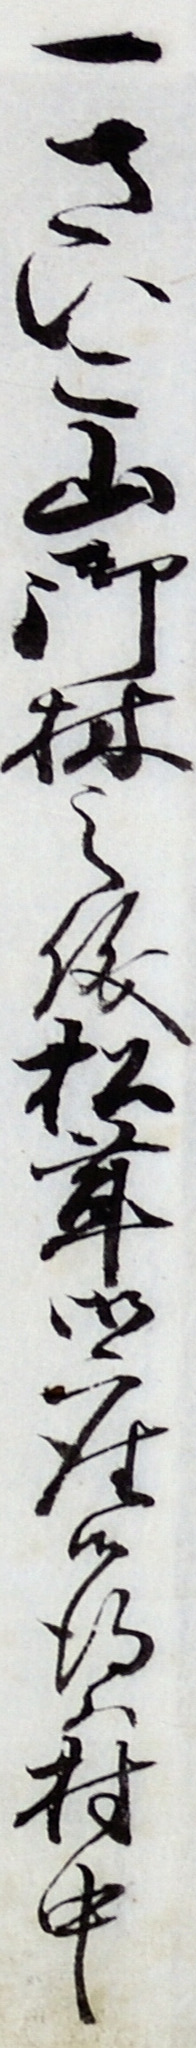一さいこ山御林之儀松茸御座候得は村中
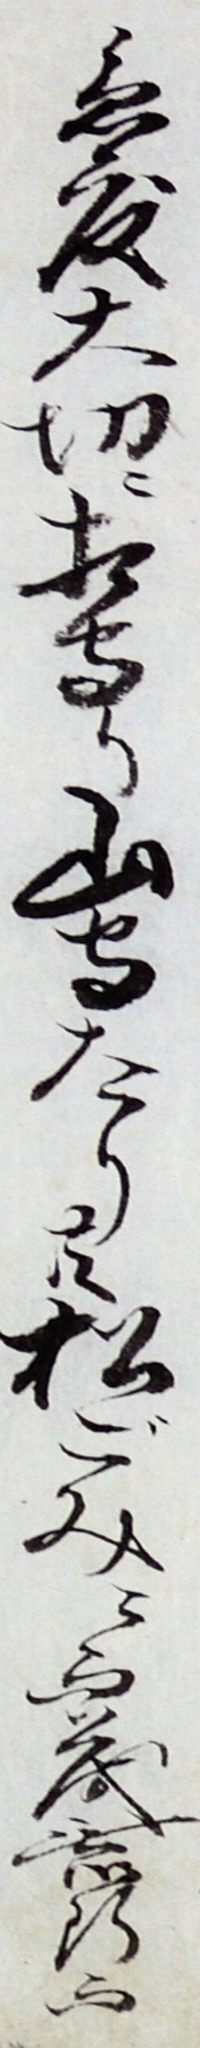急度大切に相守り山守たり共松ごみにても無御断て

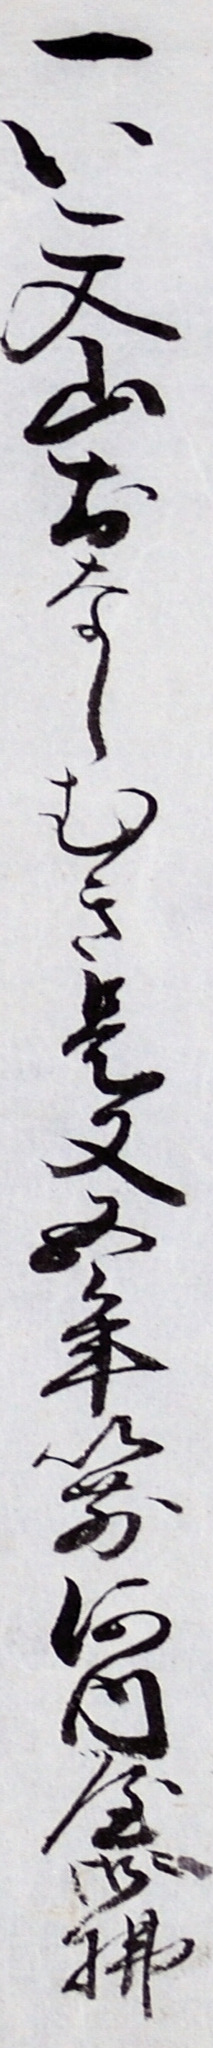一いこ入山おなしむき是又五年以前河内屋に御払
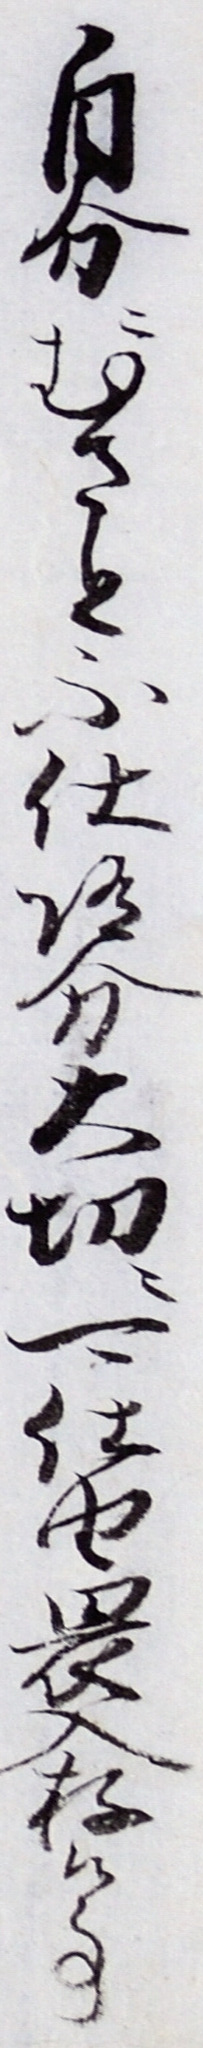自分にむさと不仕随分大切に可仕由畏入存候事
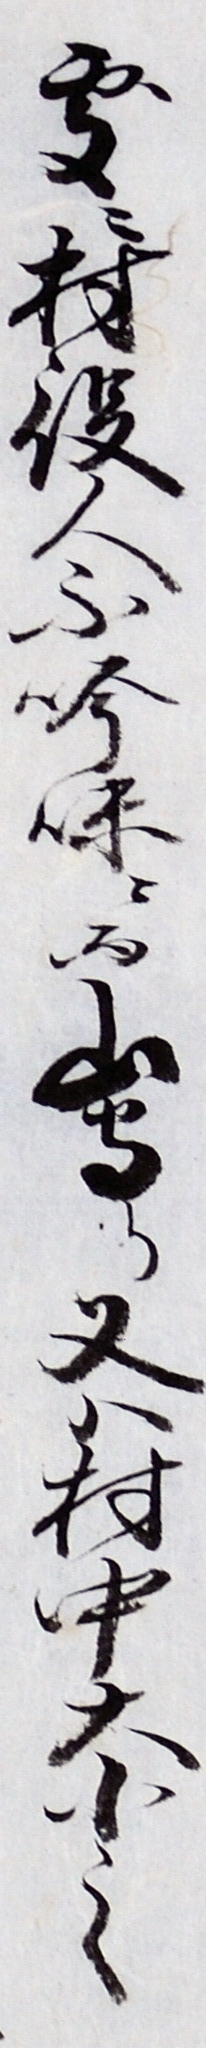処に村役人不吟味にて山守り又は村中大小之
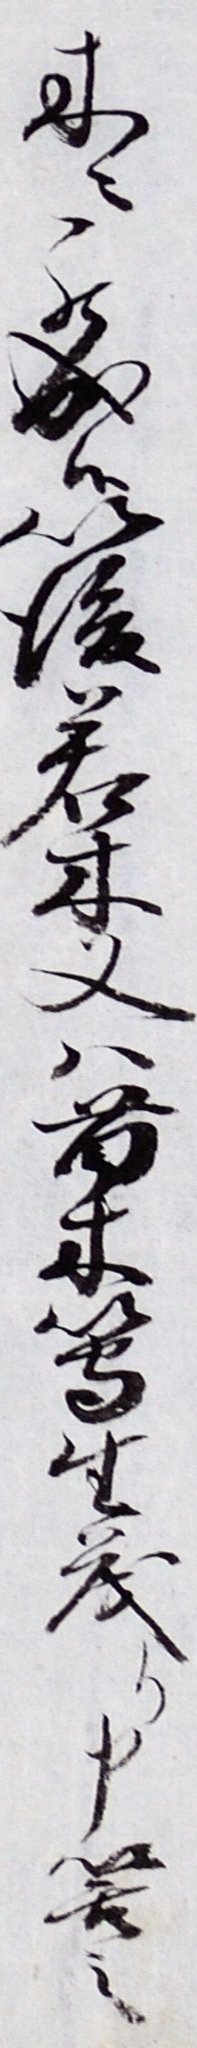木に罷成候以後若木又は苗木等生茂り申筈之
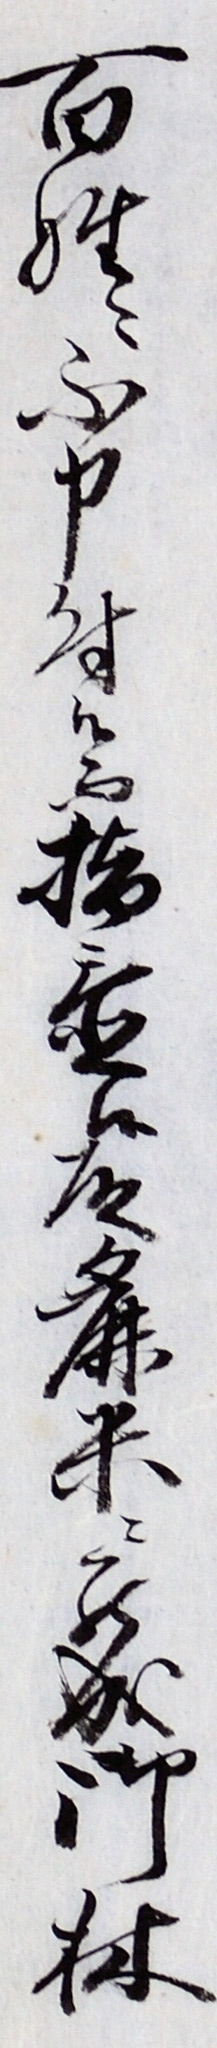百姓に不申付候て指置候故麁末に罷成御林
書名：御林御竹藪証文控
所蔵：伊那市立高遠町図書館・合同会社AMANE
